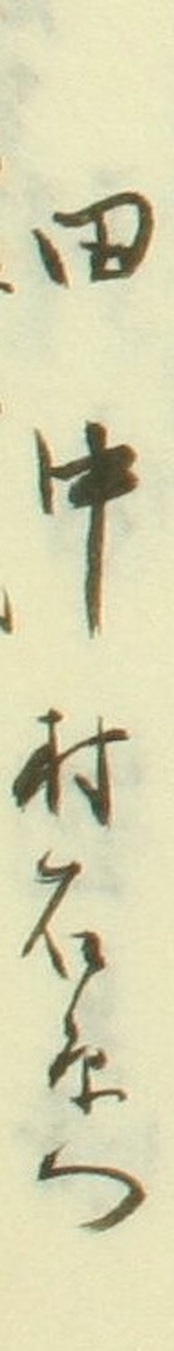同同田中村右衛門
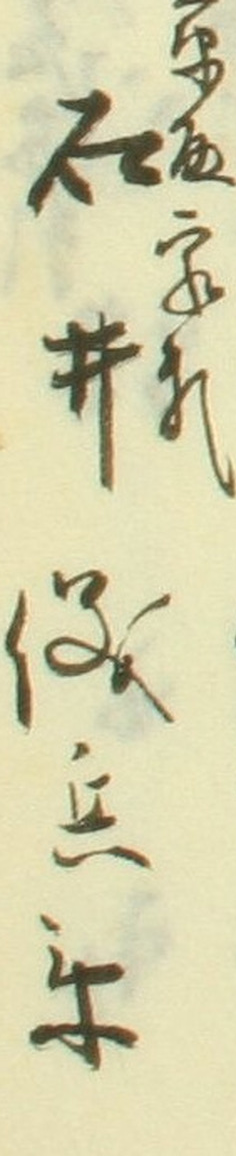石井儀兵衛

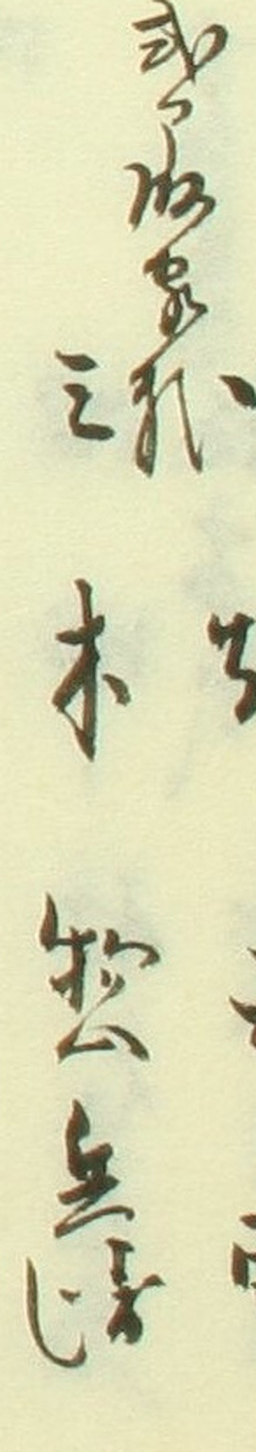三木惣兵衛
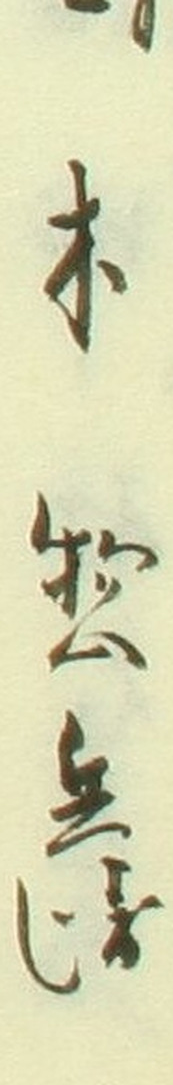三木惣兵衛
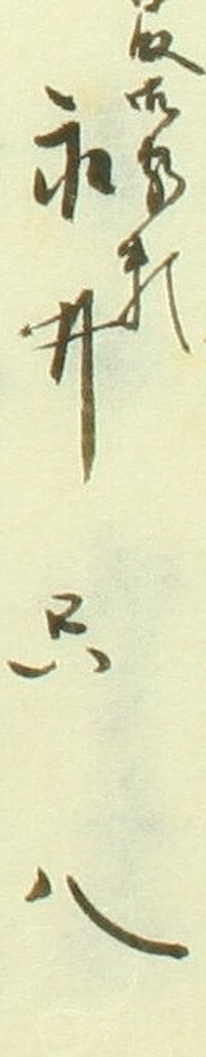永井五八
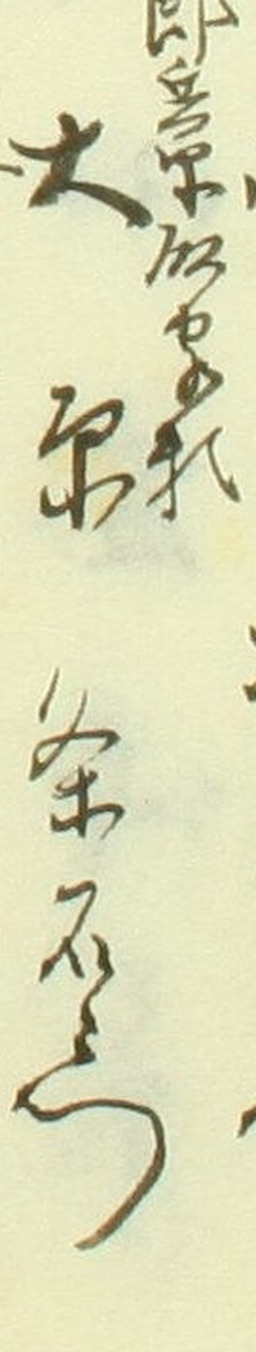大原条右衛門
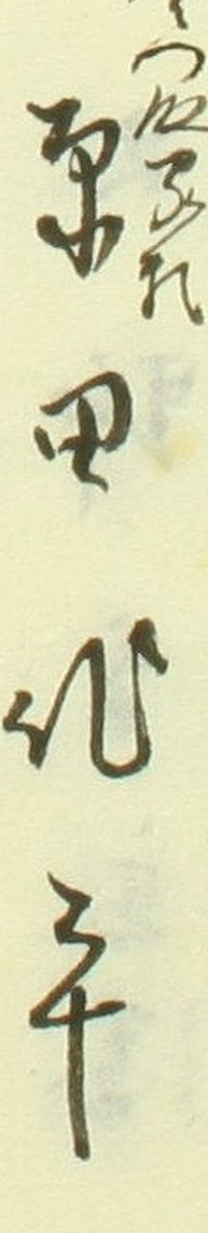原田作平
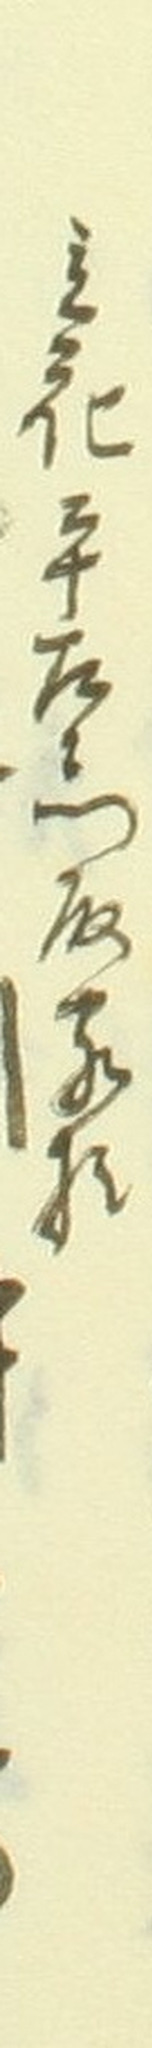同立花左衛門殿家頼
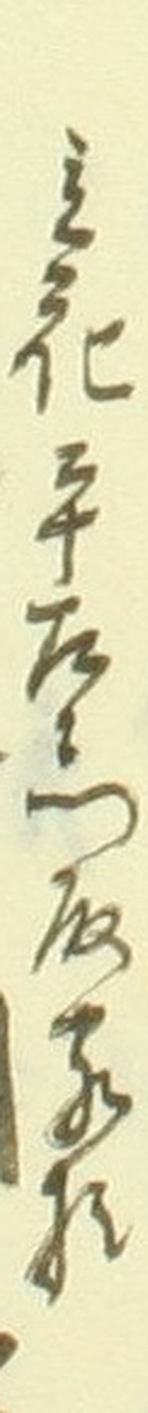同立花左衛門殿家頼
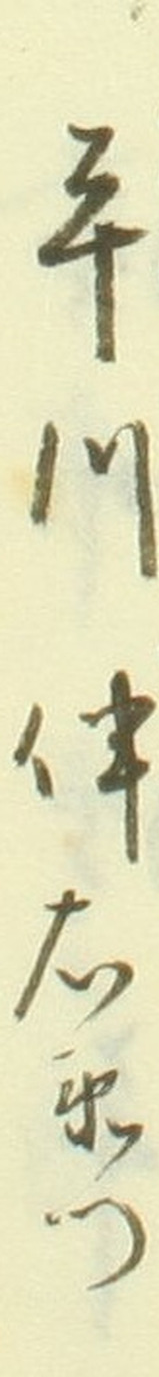平川伴右衛門
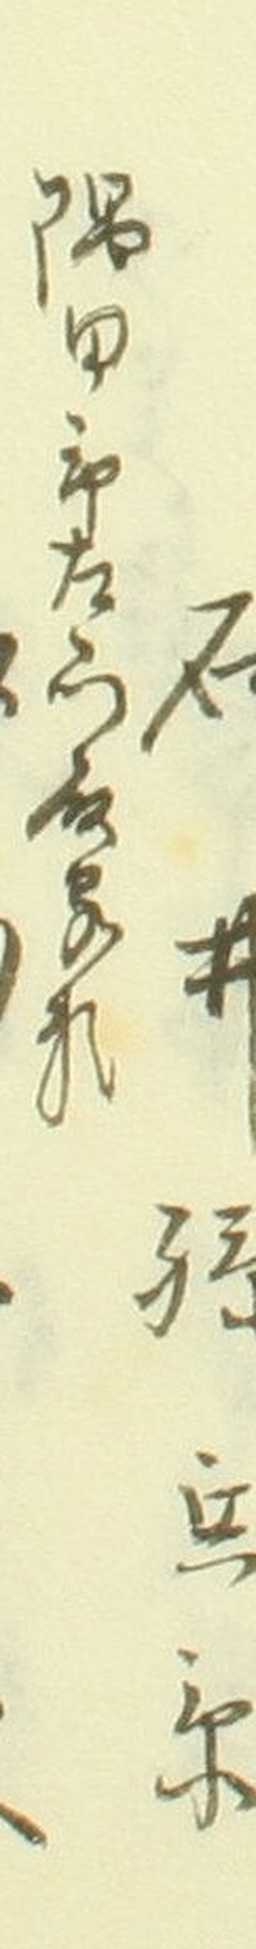同隅田市左衛門殿家頼
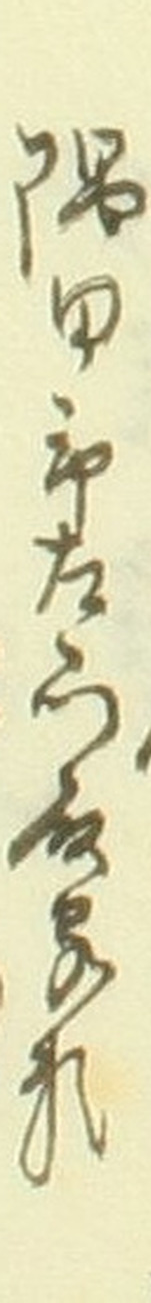同隅田市左衛門殿家頼
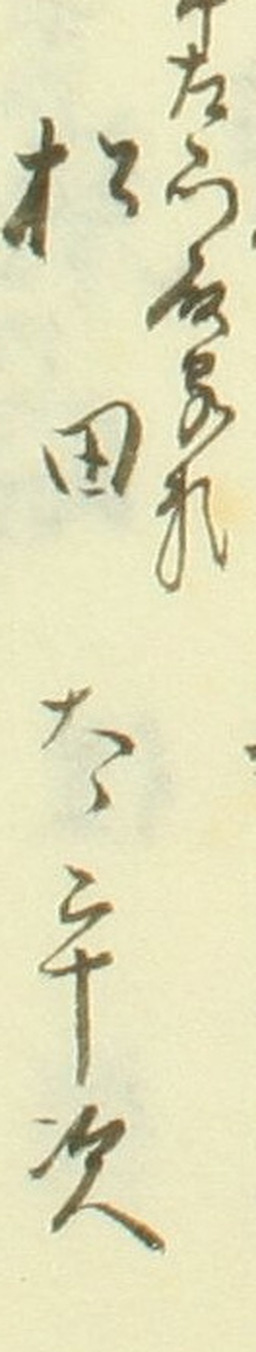杉田太平次
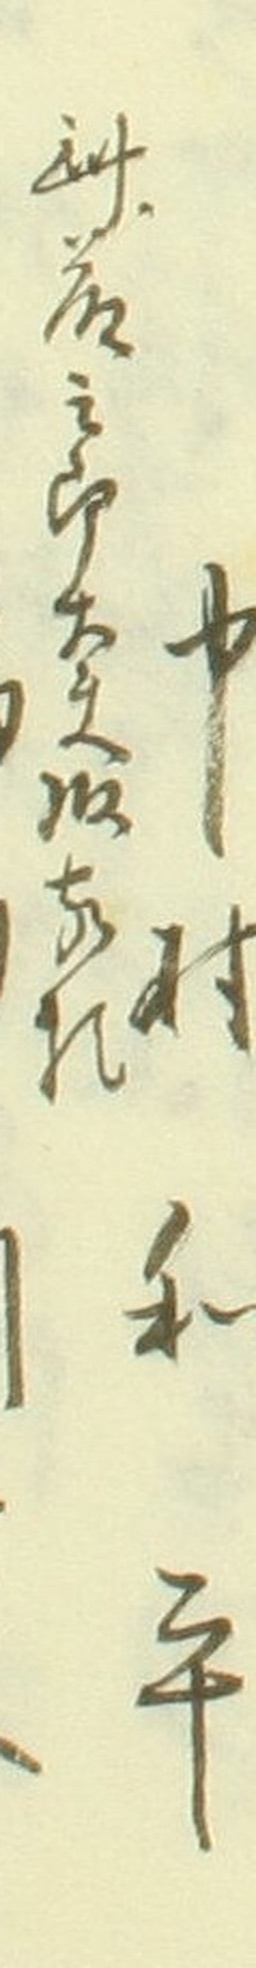同斎藤三郎太夫殿家頼
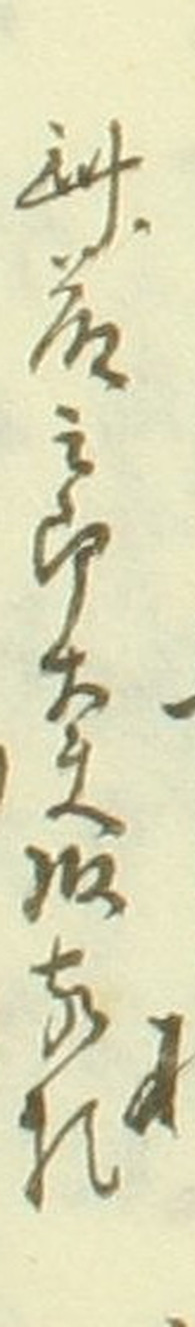同斎藤三郎太夫殿家頼
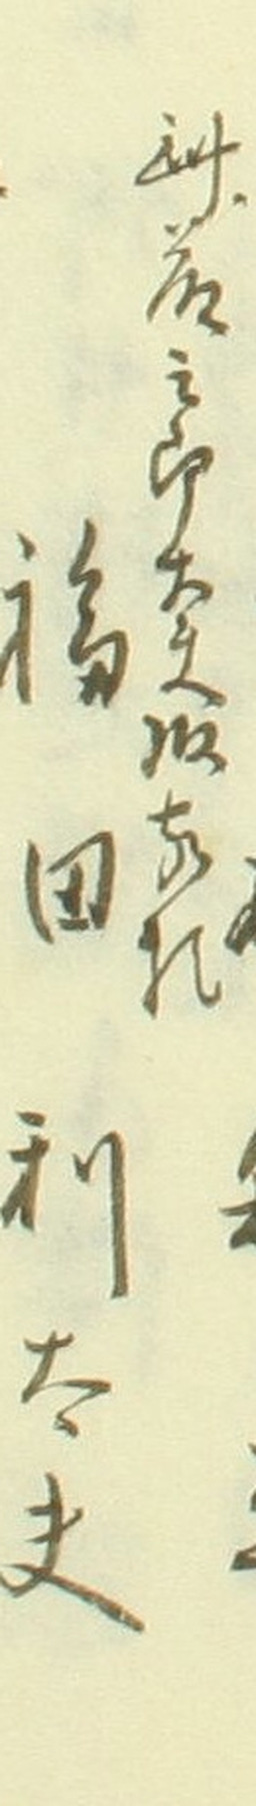福田利太夫
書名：唐船漂流記 三
